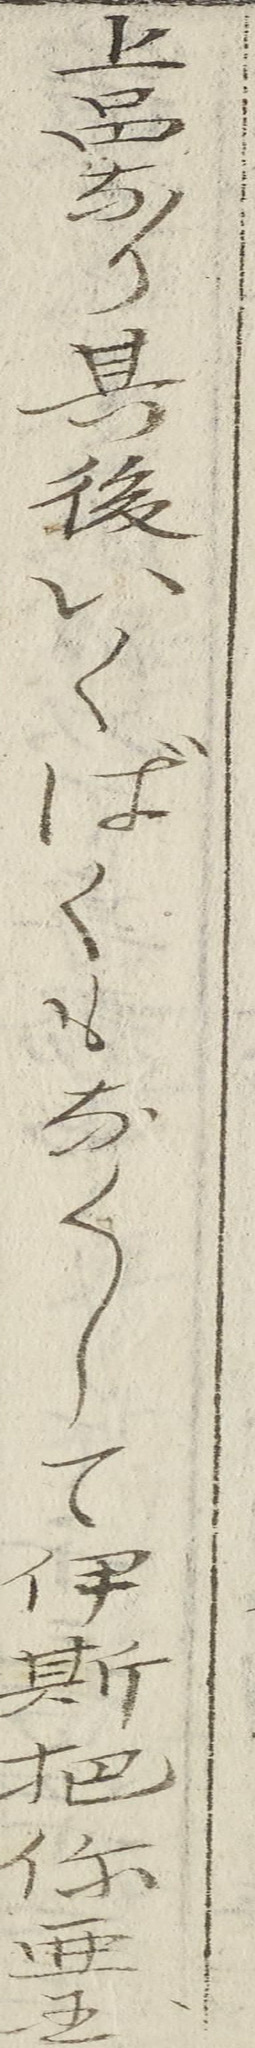上品なり其後いくばくもなくして伊斯把你亜国
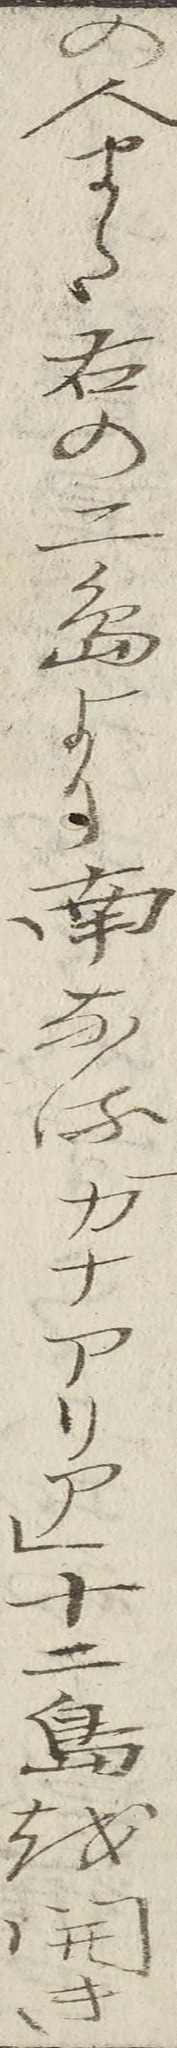の人また右の二島より南なる「カナアリア」十二島を開き
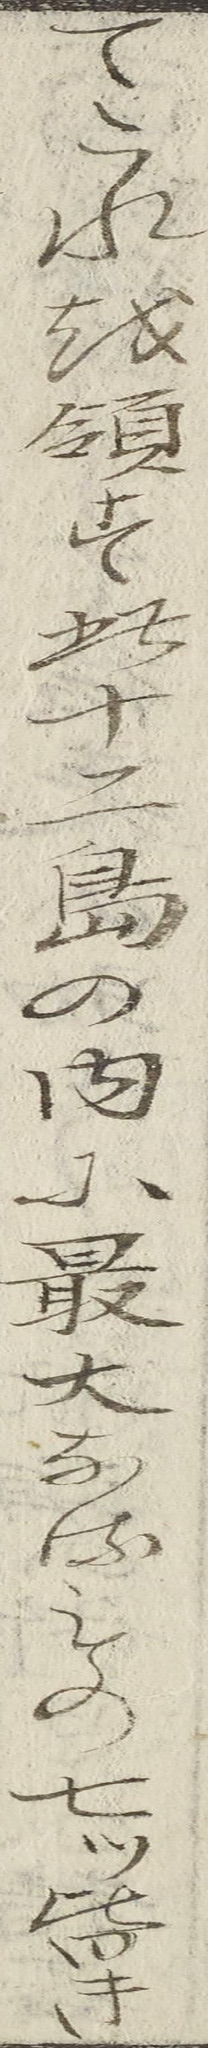てこれを領す此十二島の内に最大なるもの七ッ皆き
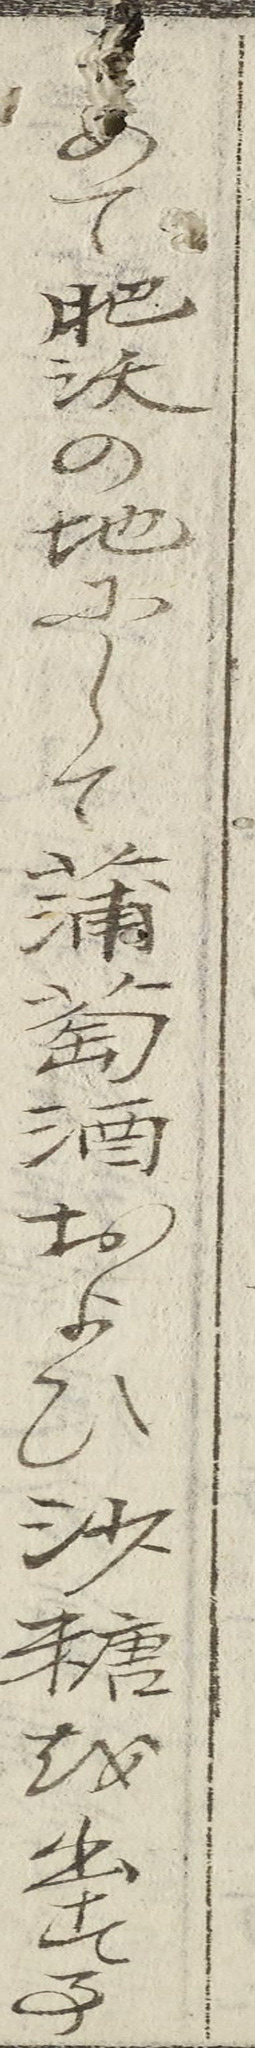はめて肥沃の地にして蒲萄酒およひ沙糖を出す事
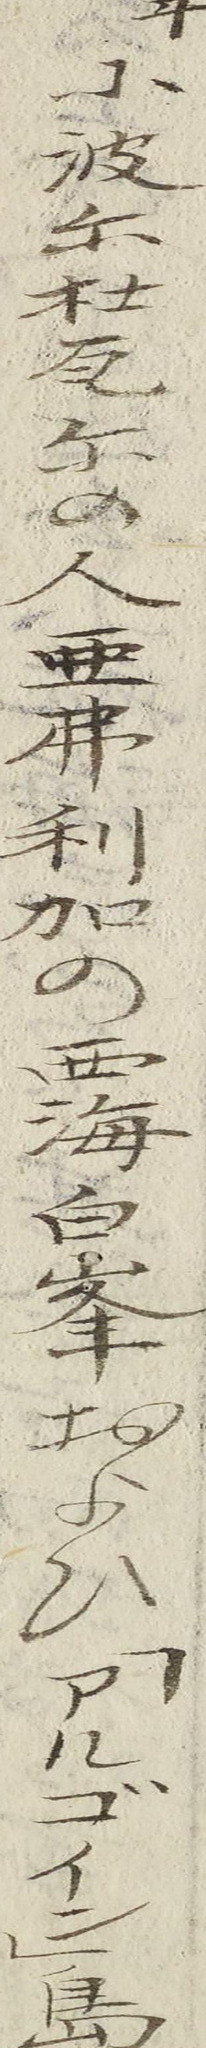年に波尓瓦尓の人亜弗利加の西海白峯およひ[アルゴイン」島
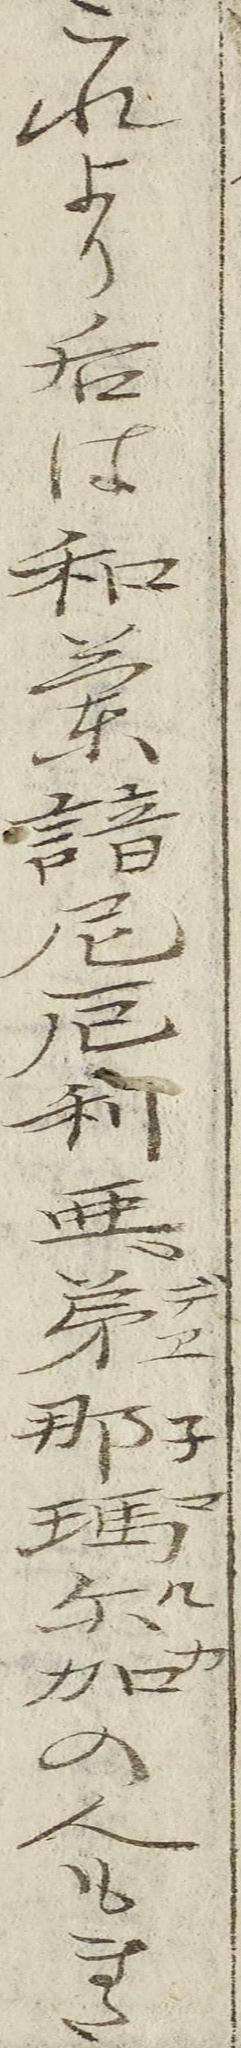これより後は和蘭諳尼厄利亜。弟那瑪尓加の人もまた
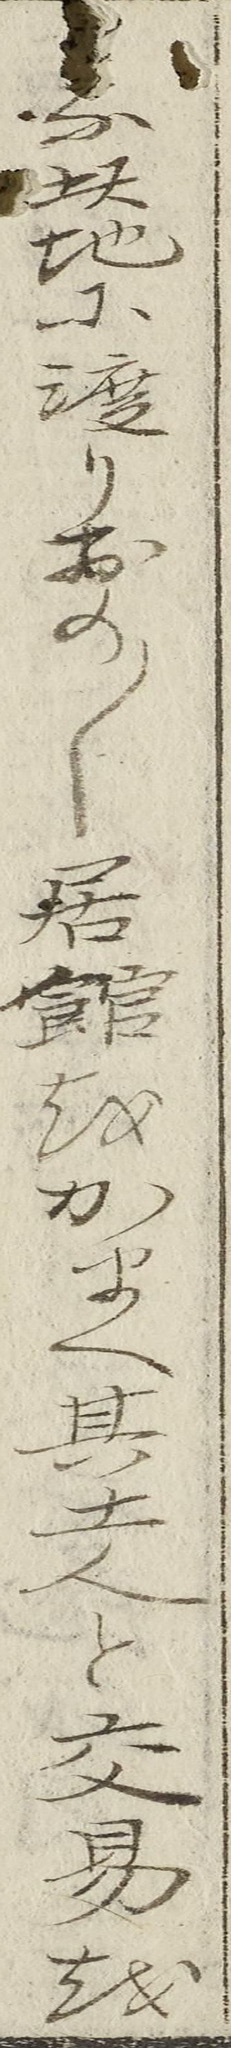ふ此地に渡りおの〳〵居館をかまへ其土人と交易を
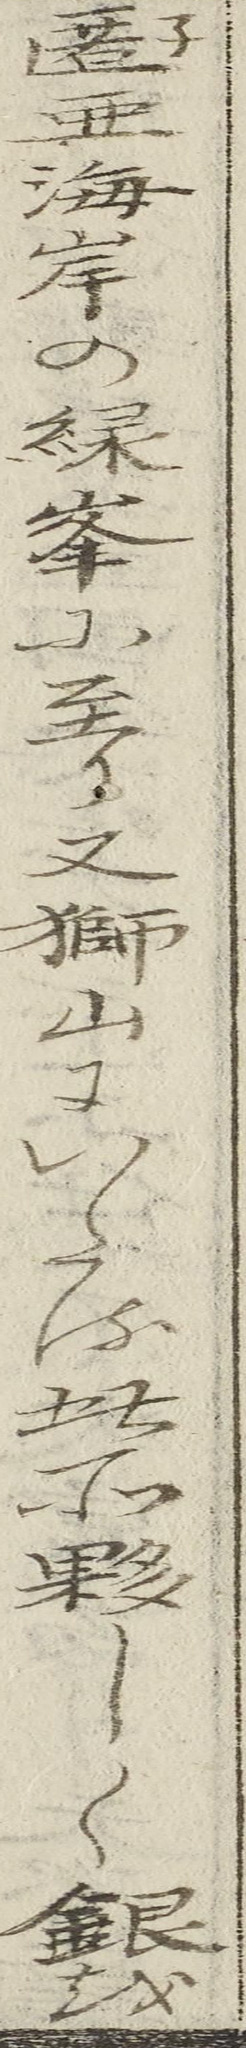匿亜海岸の緑峯に至り又獅山にいたる此所夥しく銀を
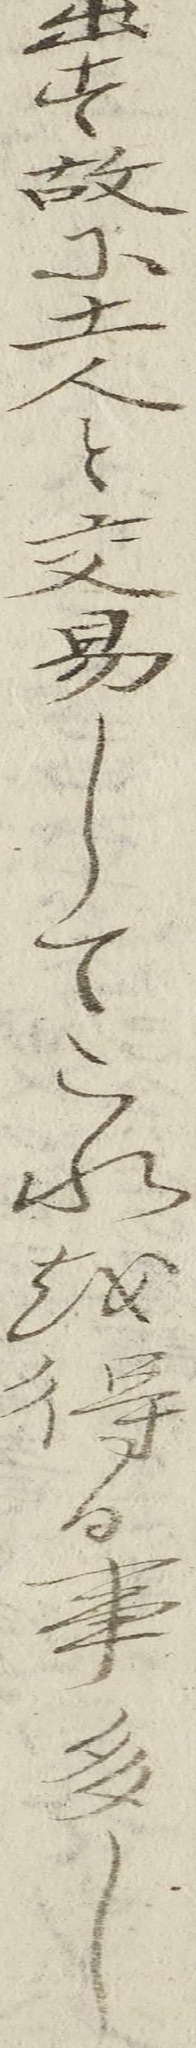出す故に土人と交易してこれを得る事多し
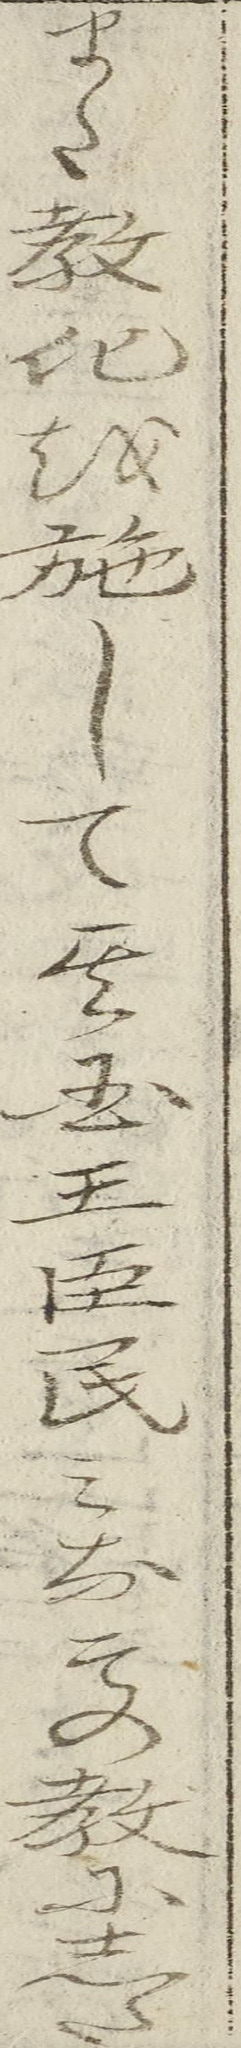また教化を施して其国追う臣民ミなその教にした
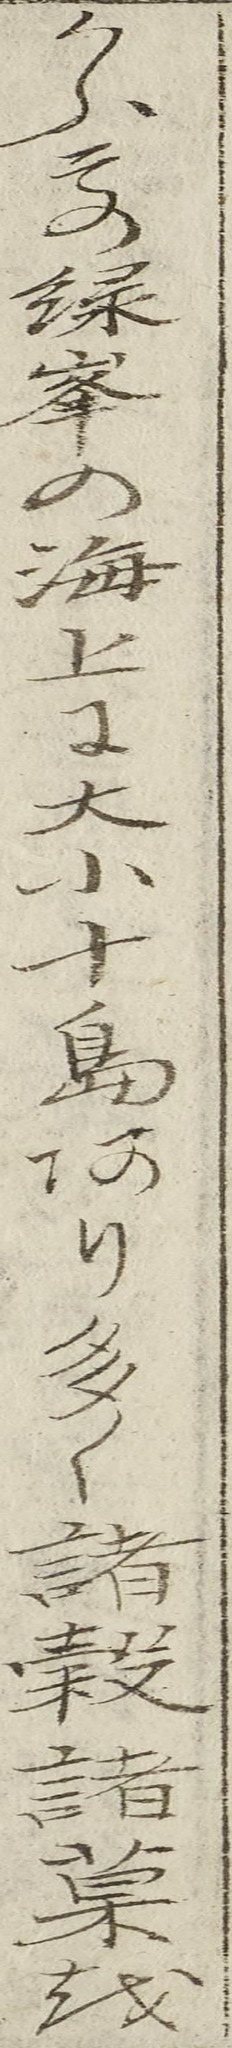かふその緑峯の海上に大小十島あり多く諸穀諸菓を
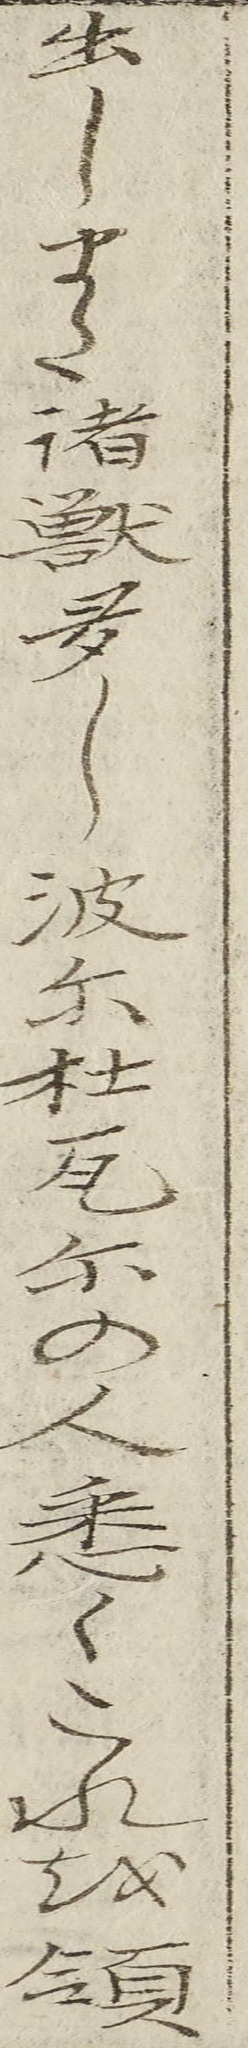出しまた諸獣多し波尓杜瓦尓の人悉くこれを領
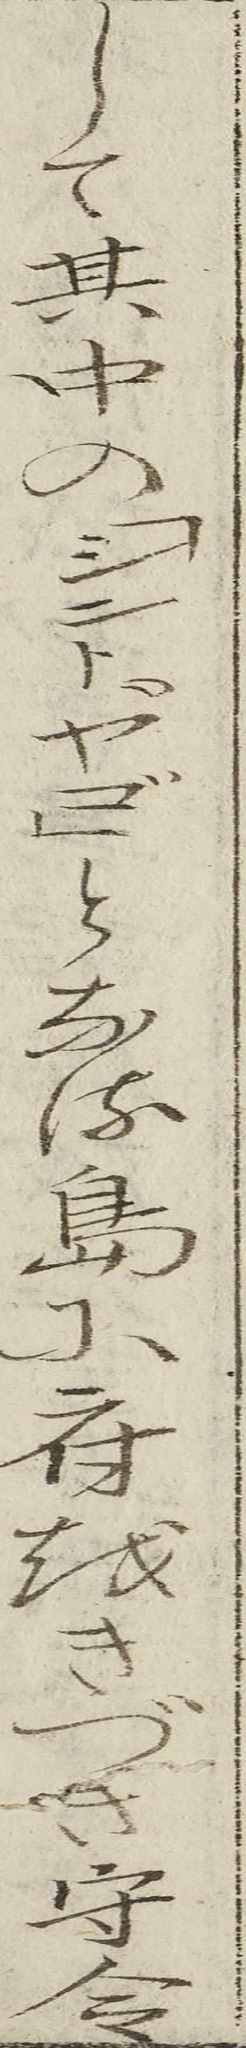して其中の「シンㇳ。ヤゴ」となる島に府をきづき守令

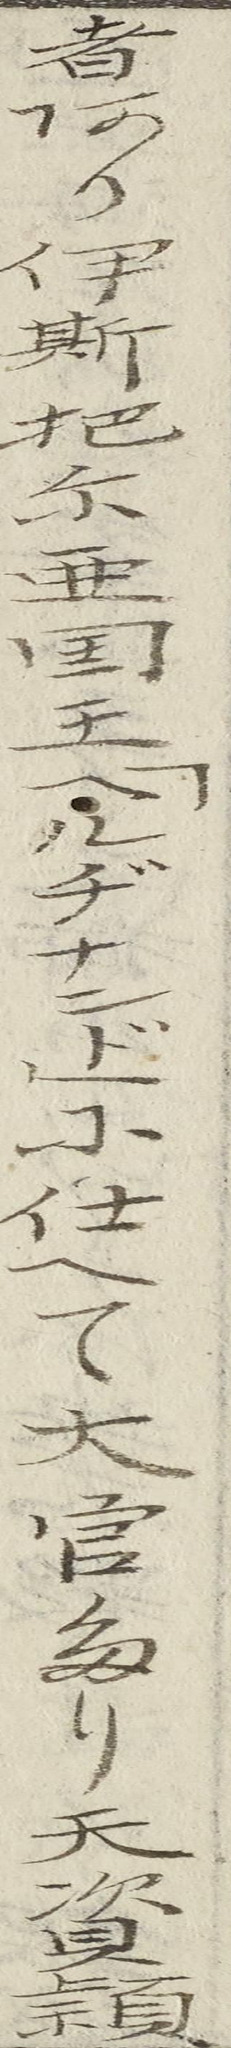者あり伊斯把尓国王「ㇸルヂナンド」に仕へて大官たり天資頴
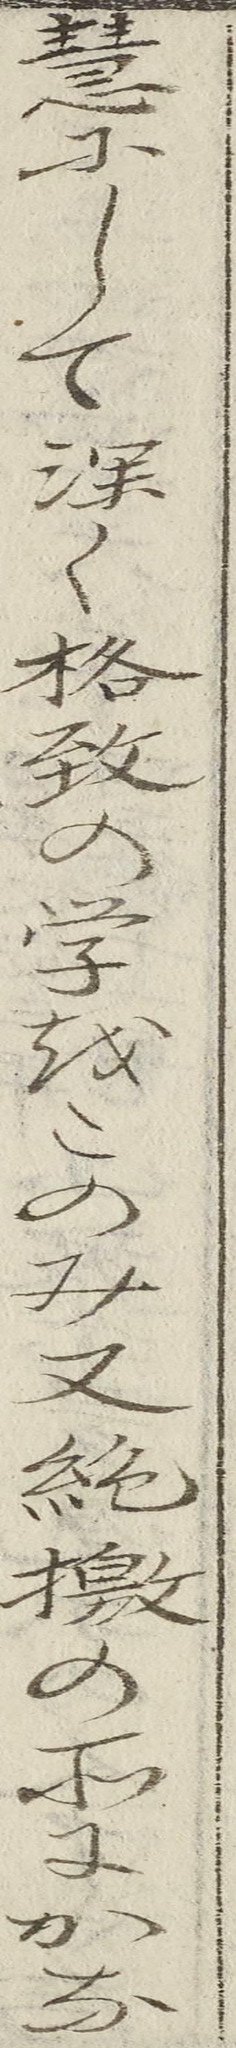慧にして深く格致の学をこのみ又絶檄の所にかな
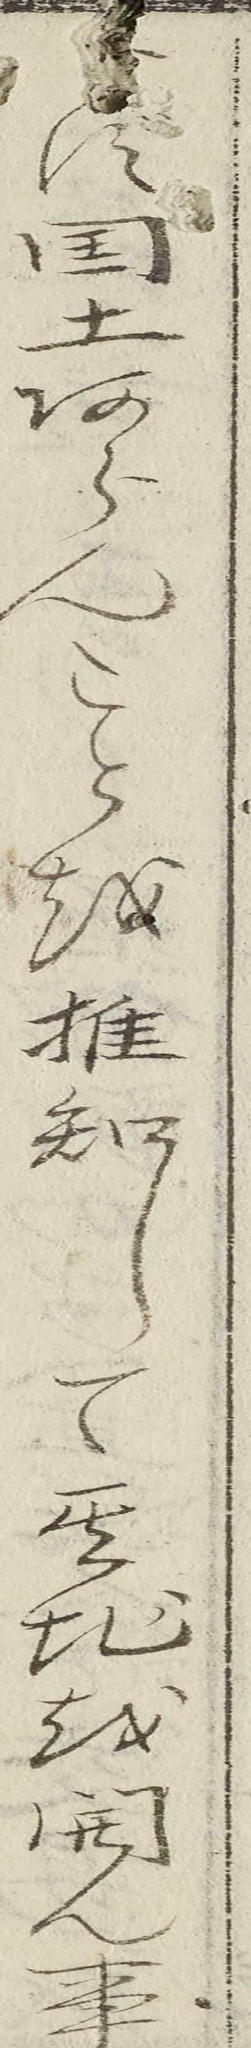はす国土あらんことを推知して其地を開ん事
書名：西洋雜記　乾
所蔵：東京大学地震研究所図書室 Earthquake Research Institute Library, The University of Tokyo, JAPAN
